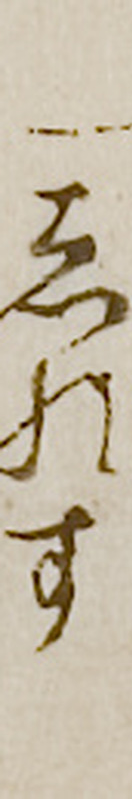しれす
